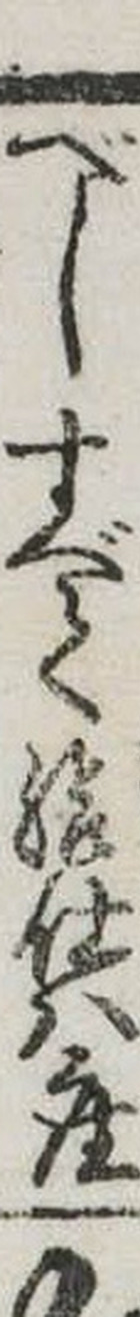べしすべて給仕は座
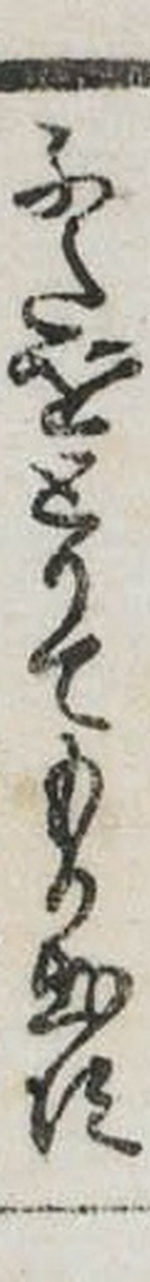ふたをとりてもり出す
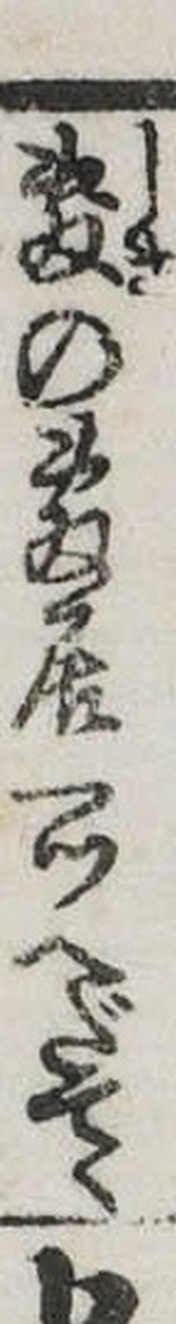敷の敷居一ツへだてゝ
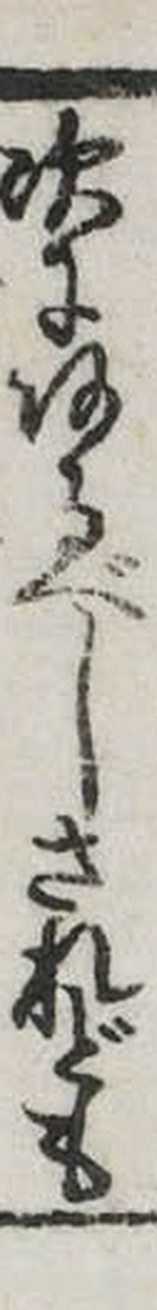次にあるべしされども
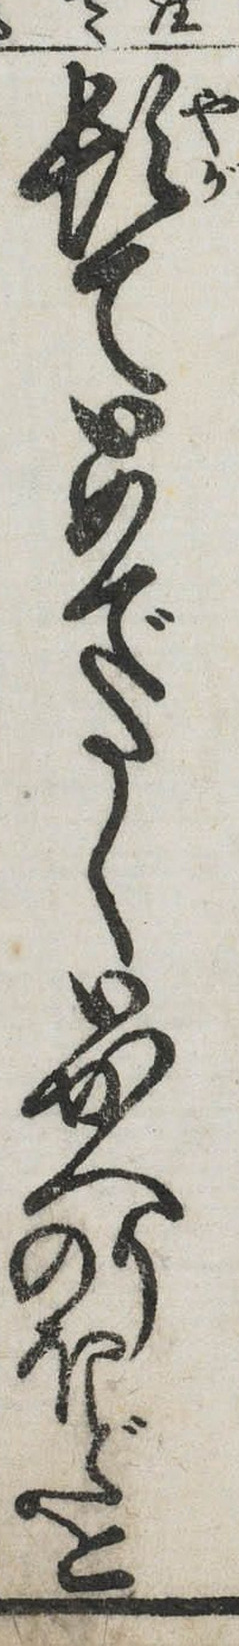頓て御めでたく御かへりのほどを
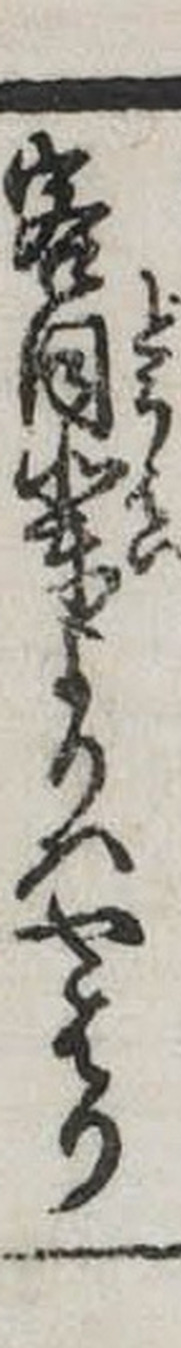客同輩よりはやはり
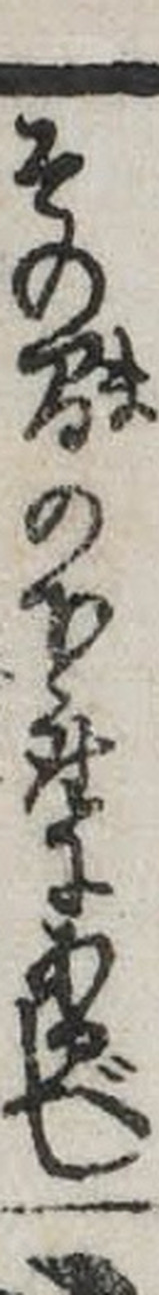その間の下座にあるべし
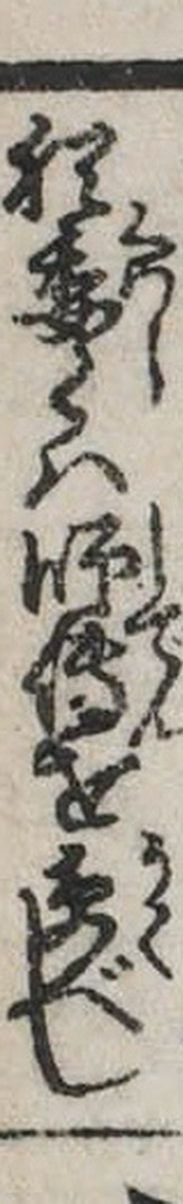猶委くは師伝を受べし
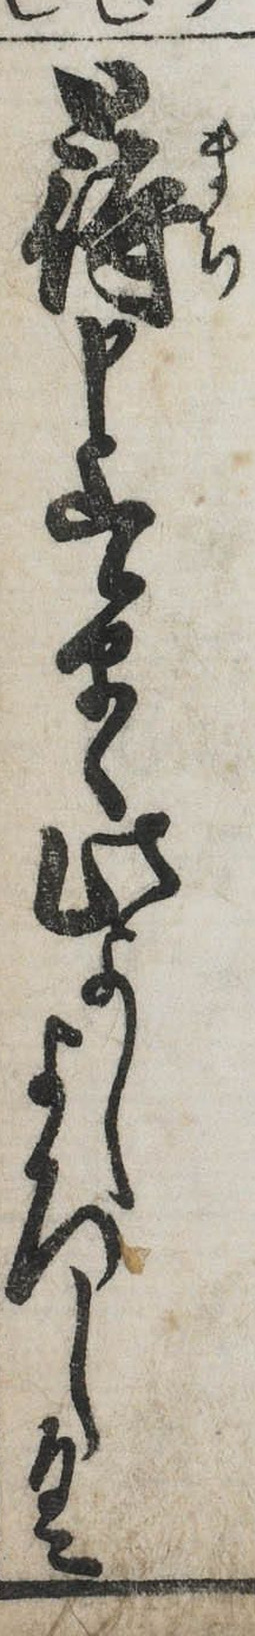御待申上候まゝ此よしよろしく

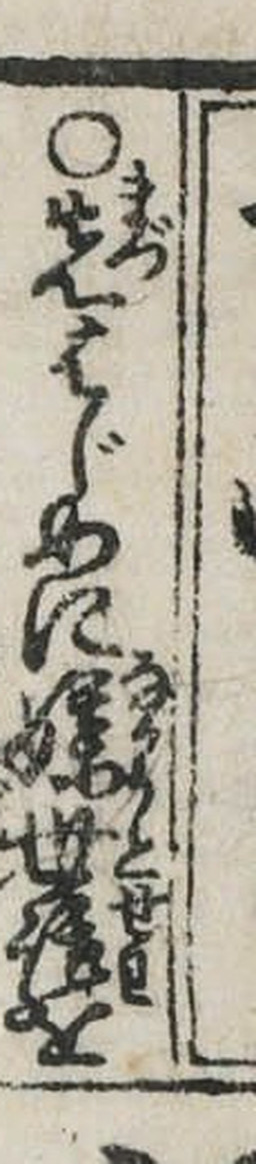○先はじめに媒世話を
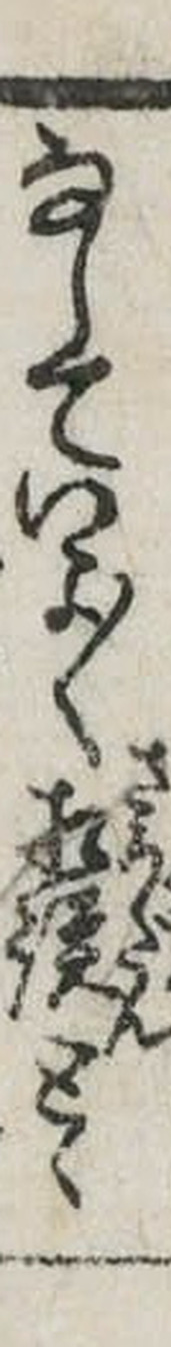なしていよ〳〵相談とゝ
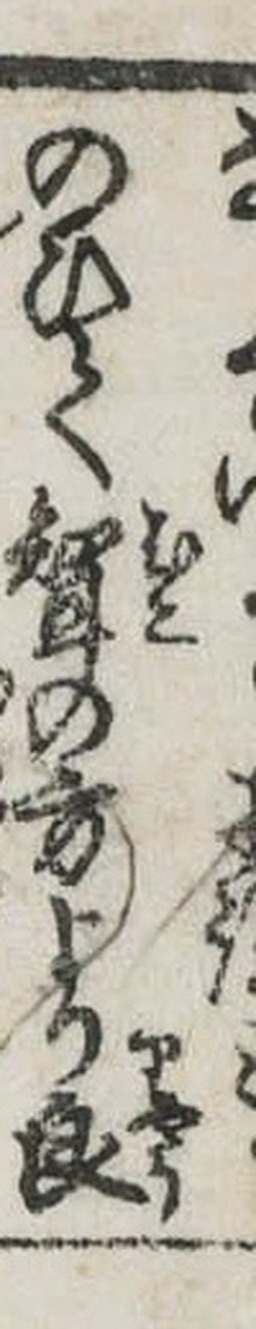のひて聟の方より良
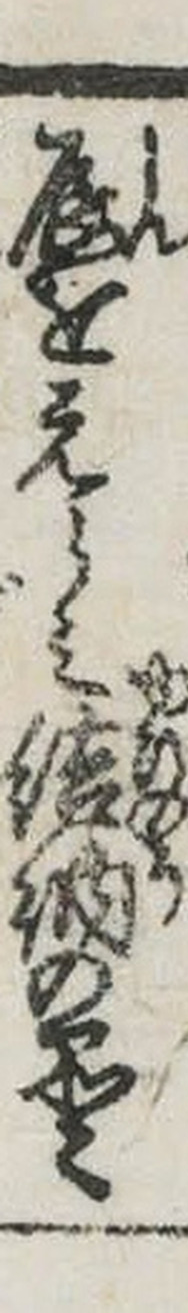辰をえらみ結納の品々
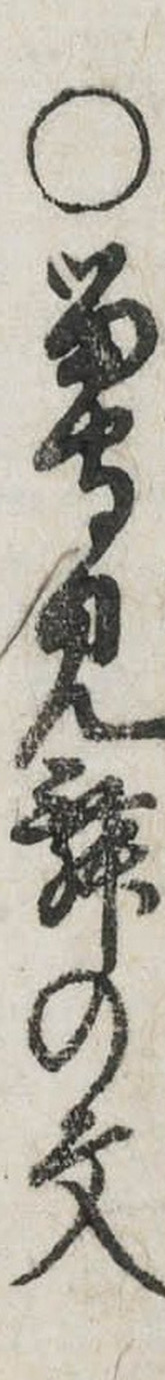○留守見舞の文
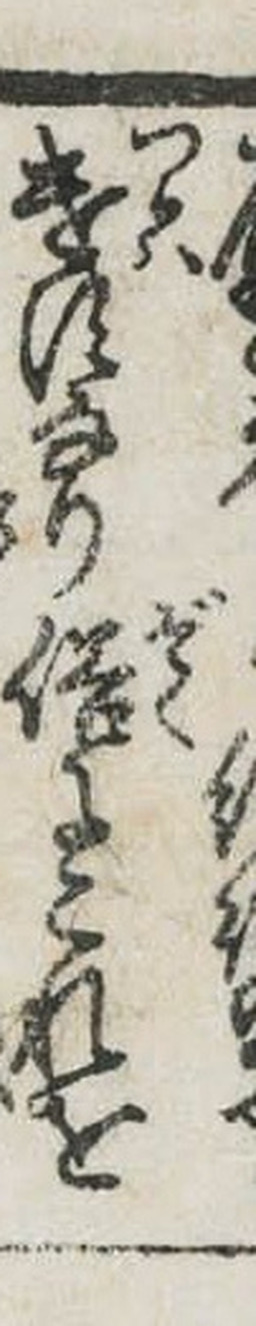遣すなり俗にこれを
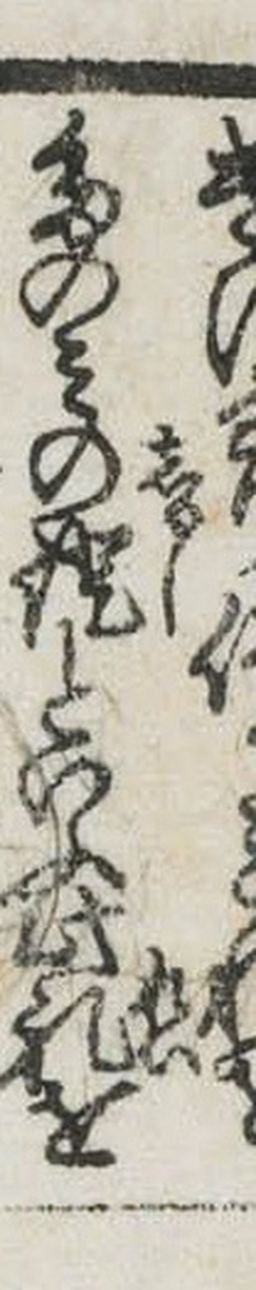たのみの證といふ此礼を
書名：頭書萬用婦人手紙之文言
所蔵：東京学芸大学教育コンテンツアーカイブ
